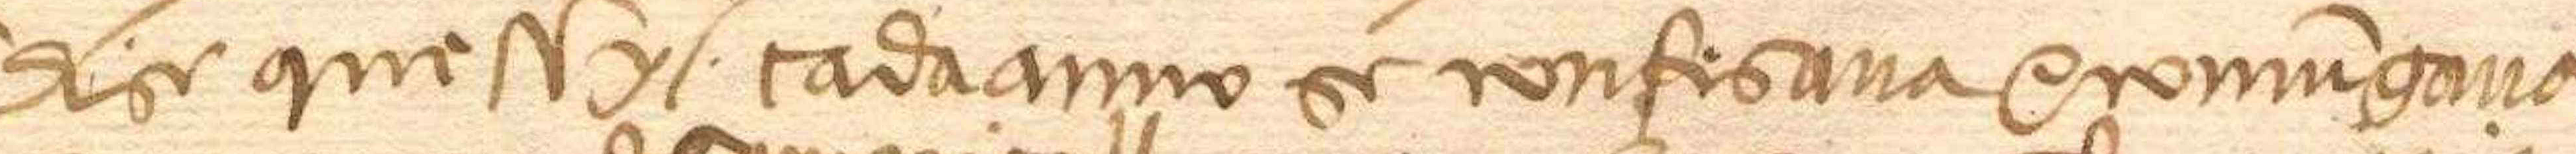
dise que ssy/. cada anno se confesaua e comūgaua
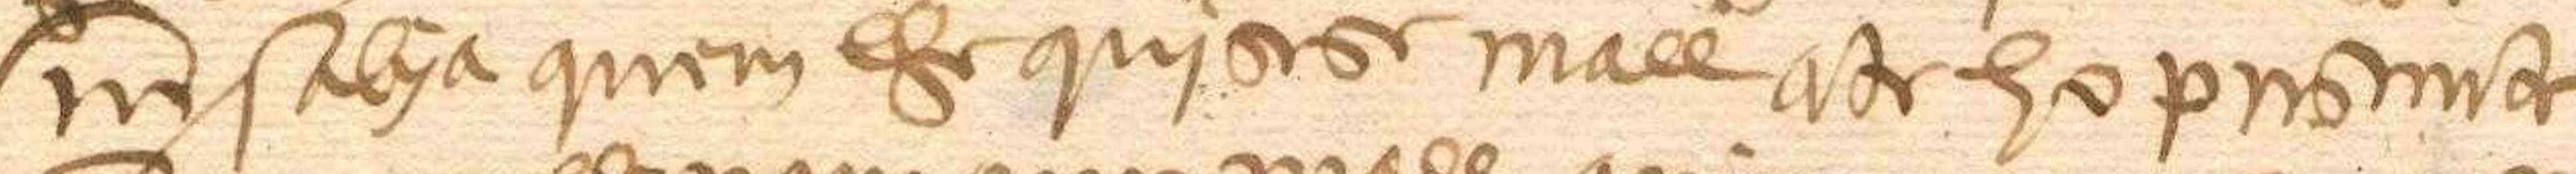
nē sabya quem lhe qujsese mall ate ho presemte
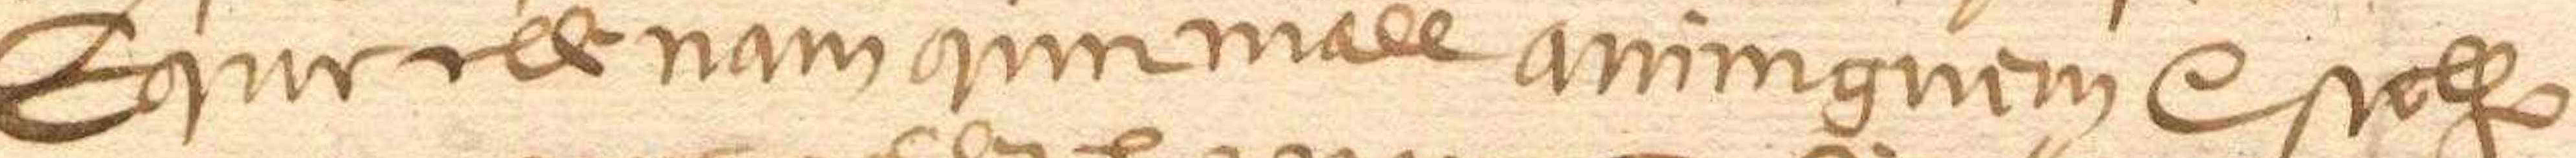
E que elle nam quer mall a nimguem e sse lho
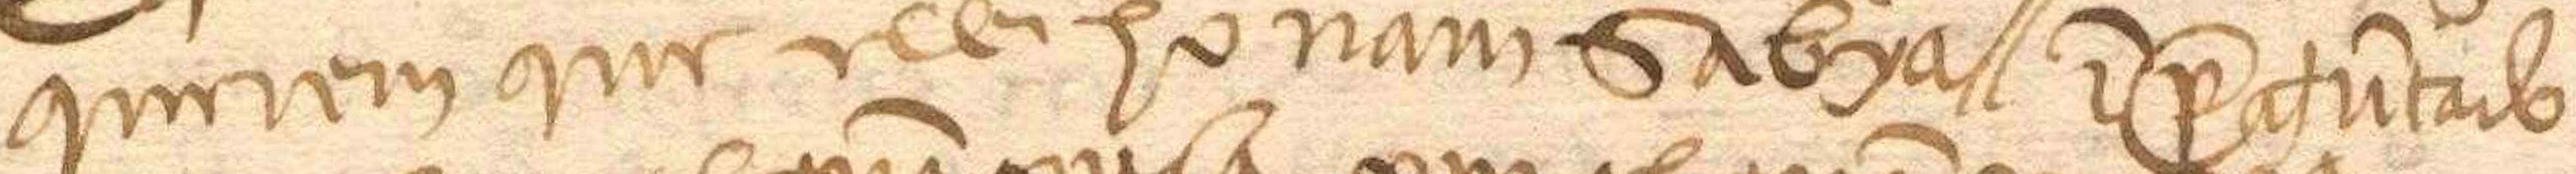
querem que elle ho nam sabya// item p̄gūtado
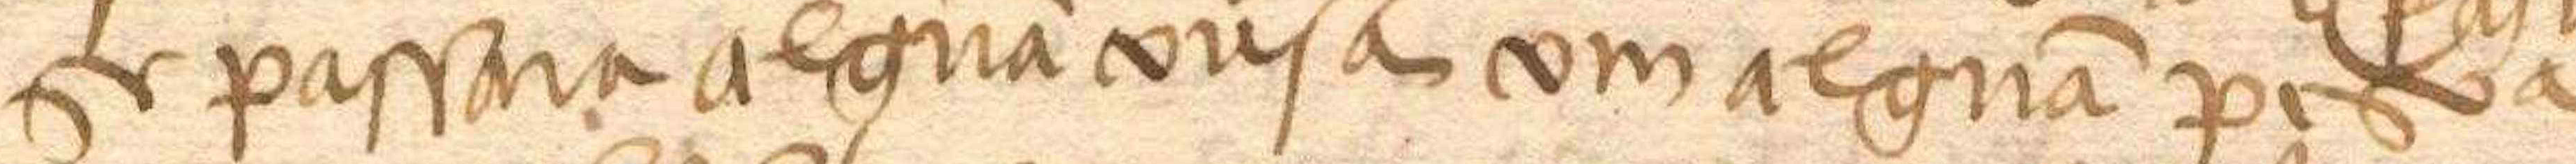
se passara algūa cousa com alguā pesoa
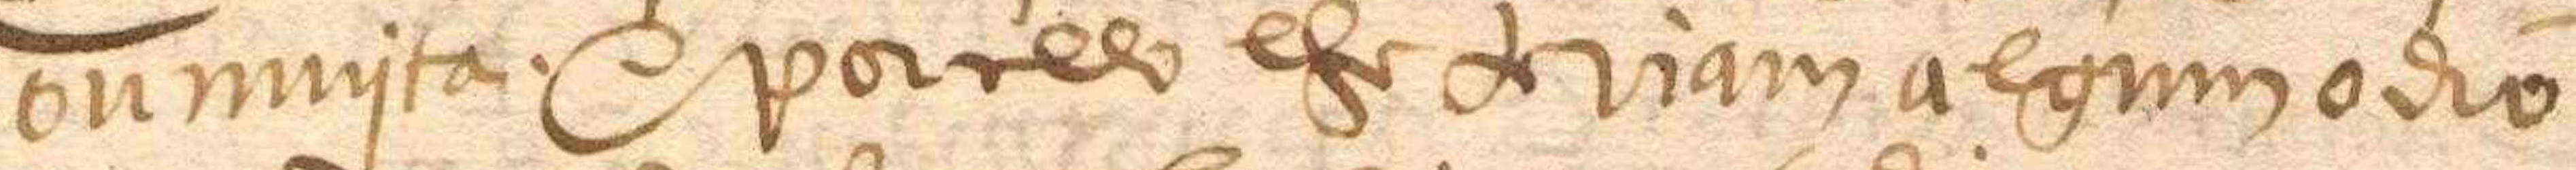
ou mujta. e por ello lhe teriam algum odio
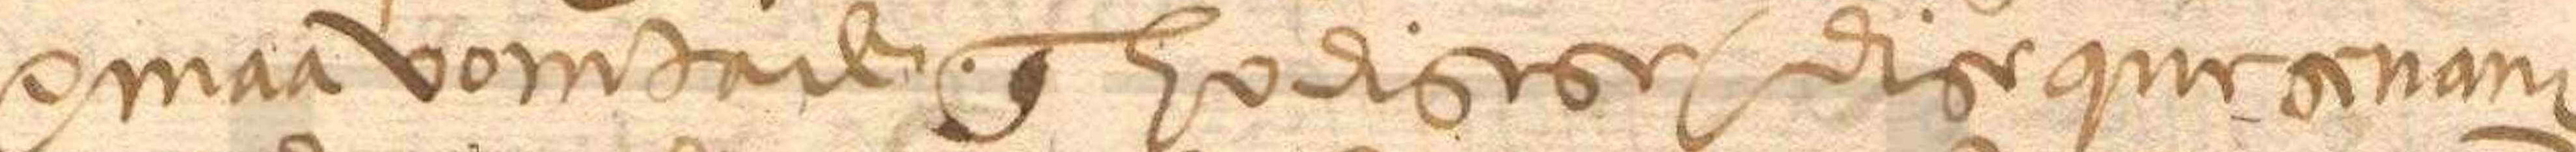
e maa vomtade q̄ ho disese/ dise que se nam
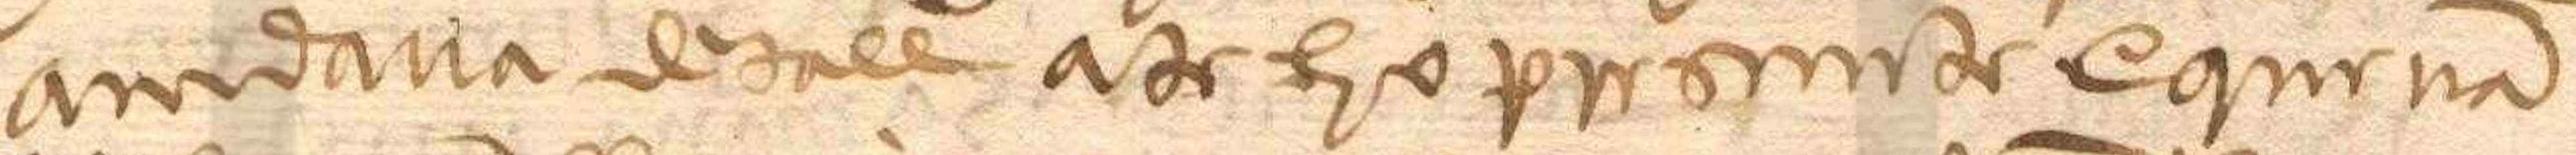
acordaua de tall ate ho presemte e que nā
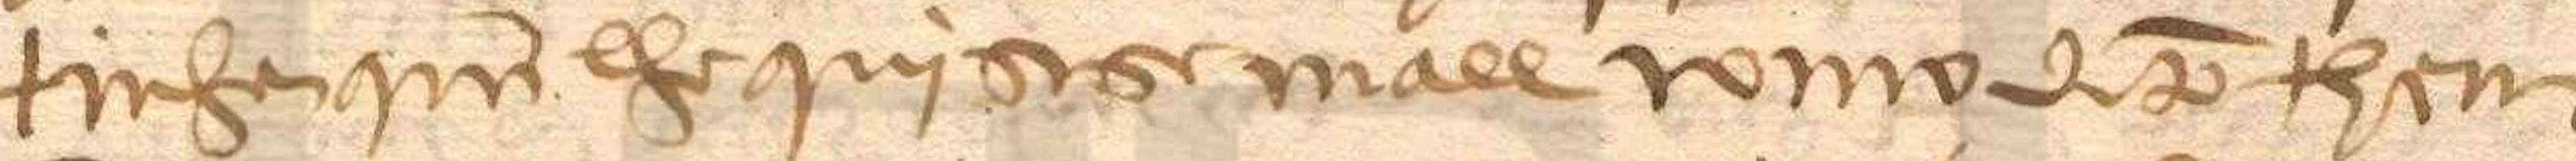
tinha quē lhe qujsese mall como dito them
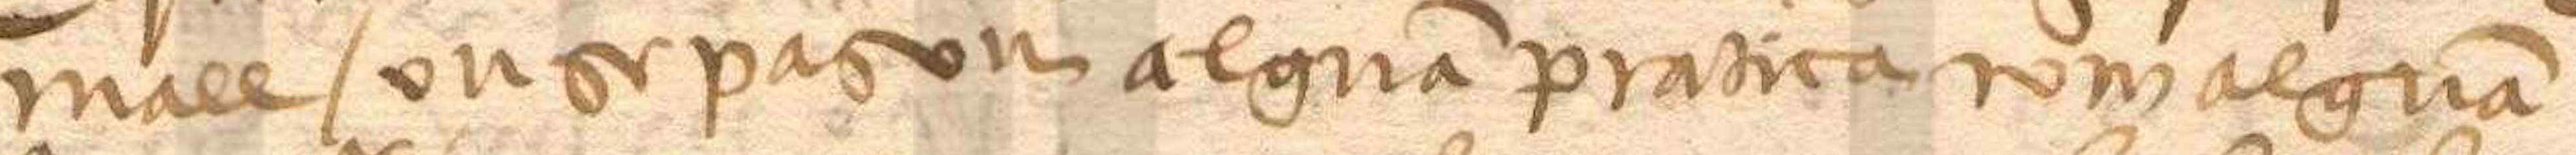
mall / ou se pasou alguā pratica com alguā
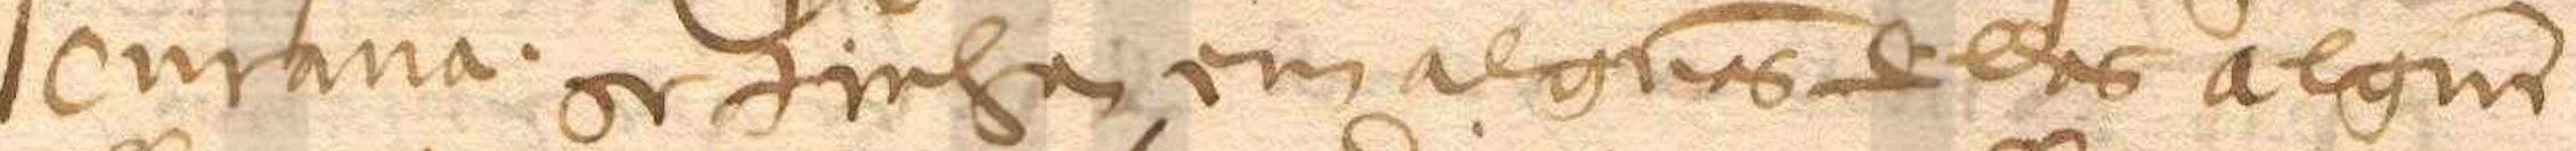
curaua. se tinha em algūas dellas alguē
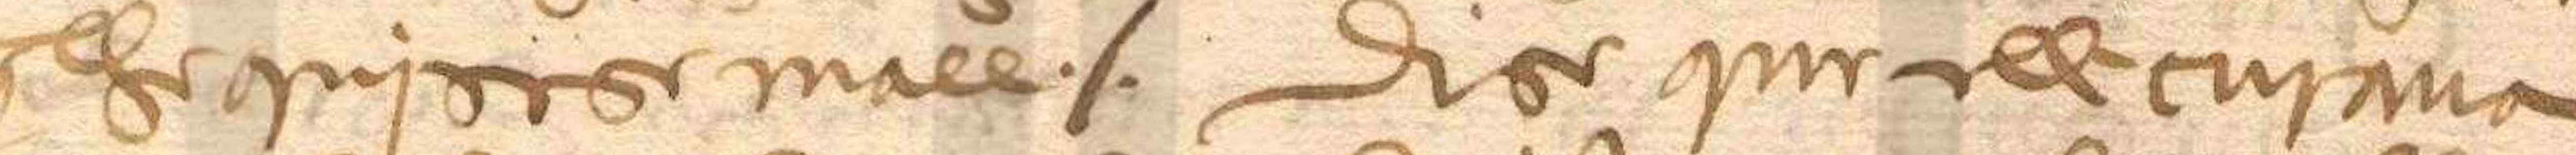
q̄ lhe qujsese mall./. dise que elle curaua
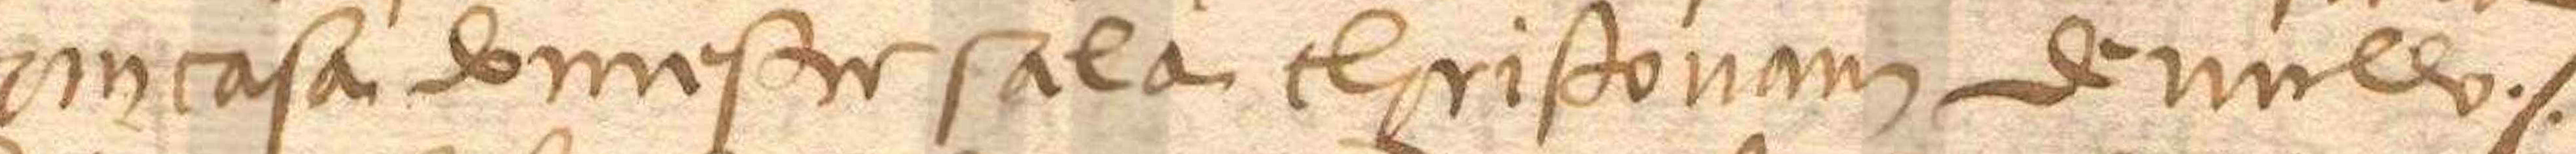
Em casa do mestre sala christouam de mello ./.
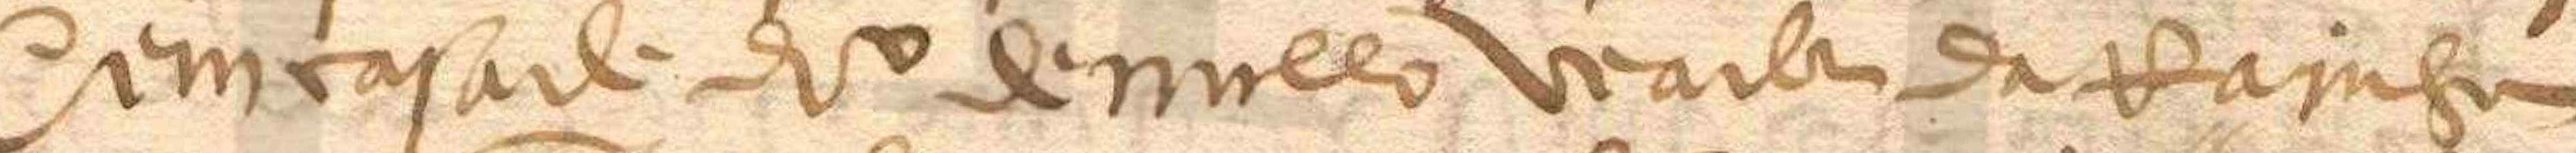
e em casa de dio de mello veador da Rainha
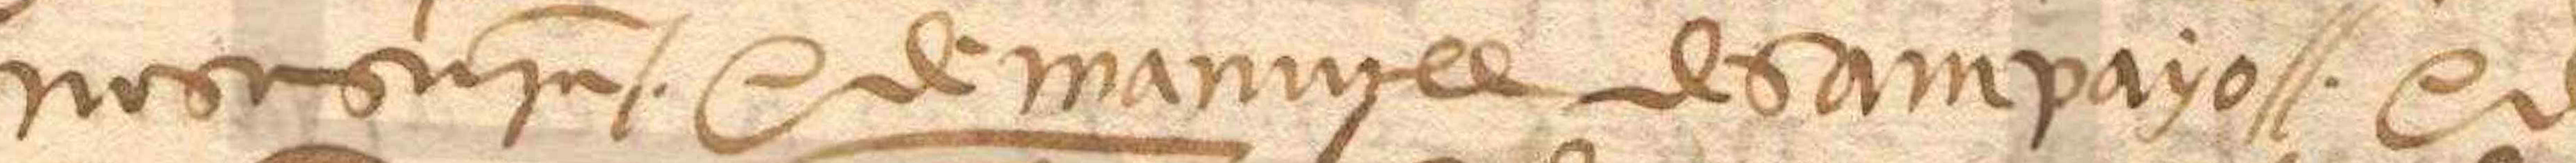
nosa snr̄a/. e de manuell de sampayo //. e de
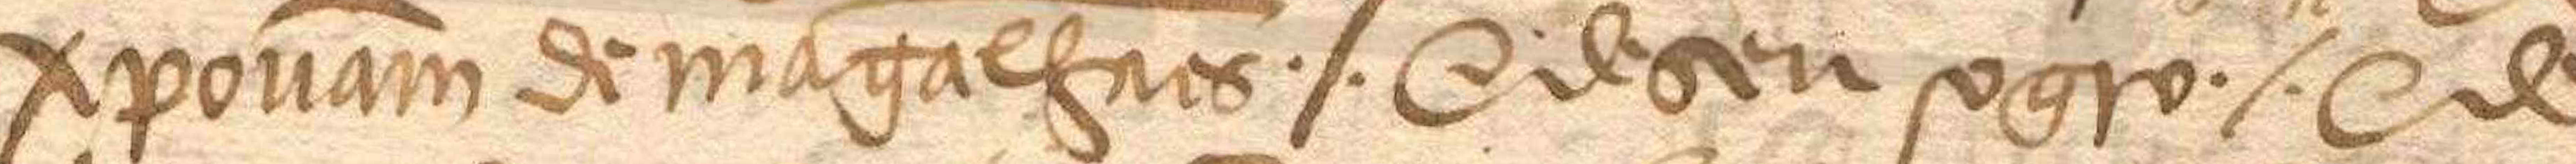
Xpoūam de magalhães./. e de seu sogro./. e de
